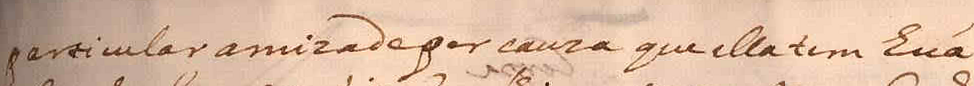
particular amizade por cauza que ella tem huā
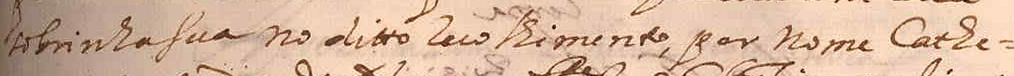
sobrinha sua no ditto Recolhimento, por nome Cathe
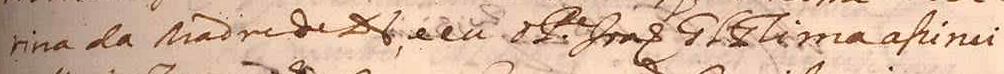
nha da Madre de Ds̄, e eu o P.e Joaõ Glz̄ Lima assinei
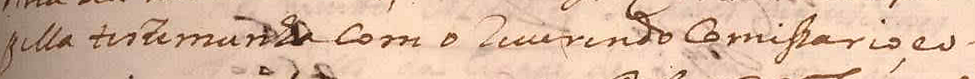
pella testemunha com o Reuerendo Comissario, e o
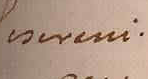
escreui.
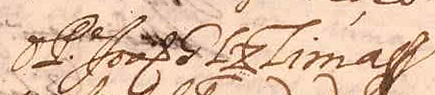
o P.e Joaõ Glz̄ Lima
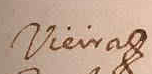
Vieira
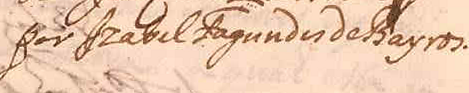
por Jzabel Fagundes de Bayros.
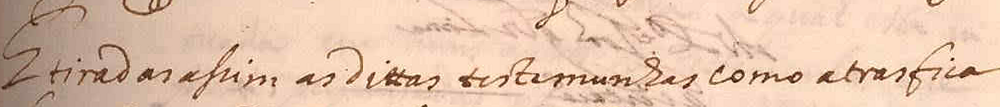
E tiradas assim as dittas testemunhas como atras fica
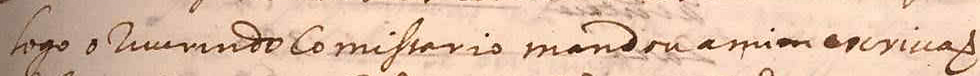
logo o Reuerendo Comissario mandou a mim escriuaõ
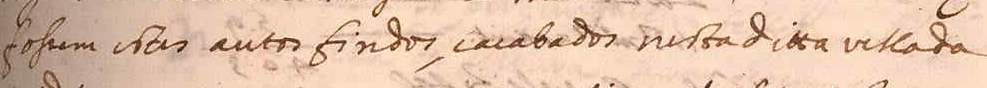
fossem estes autos findos, e acabados nesta ditta villa da
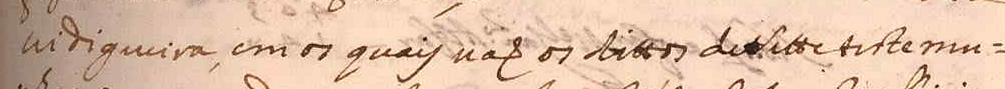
uidigueira, em os quais uaõ os dittos de sette testemu
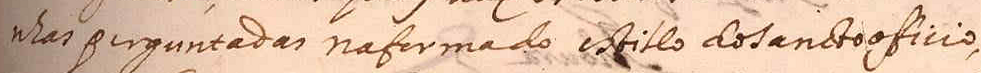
nhas perguntadas na forma do estillo do sancto officio,
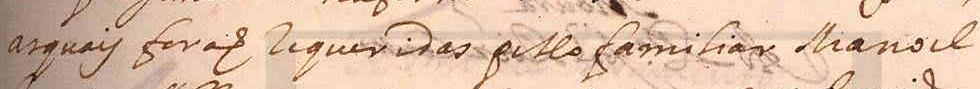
as quais foraõ Requeridas pello familiar Manoel
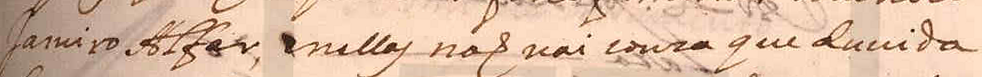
Janeiro Alfar, e nellas naõ uai couza que duuida
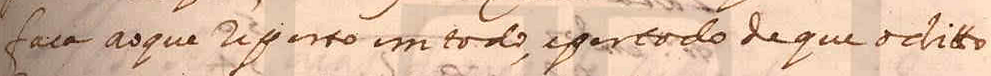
faça ao que Reporto em todo, e per todo de que o ditto
